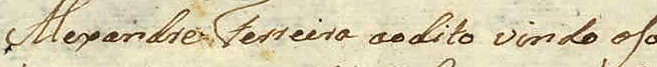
Alexandre Ferreira ao dito vindo o so
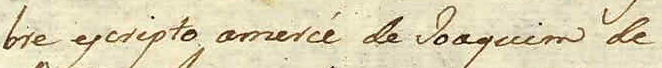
bre escripto a mercé de Ioaquim de
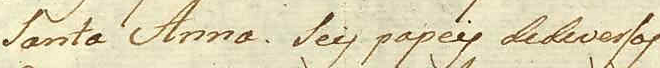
Santa Anna. seis papeis de deversas
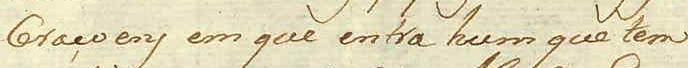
Oraçoens em que entra hum que tem
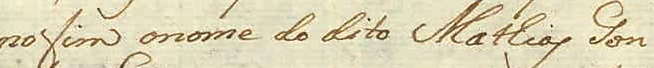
no fim o nome do dito Mathias Gon
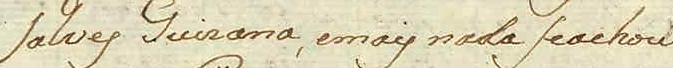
Salves Guizana, e mais nada se achou
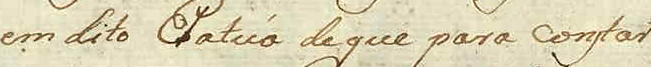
em dito Patuá de que para constar
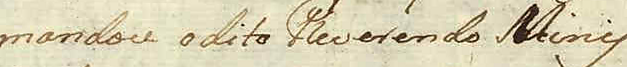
mandou o dito Reverendo Minis
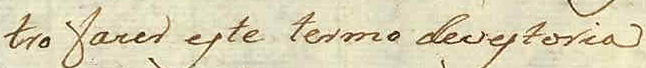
tro fazer este termo de vestoria
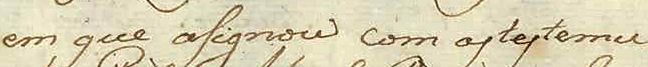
em que asignou com as testemu
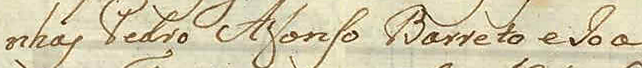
nhas Pedro Afonso Barreto, e Ioa
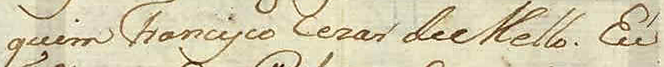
quim Francisco Cezar de Mello. Eu
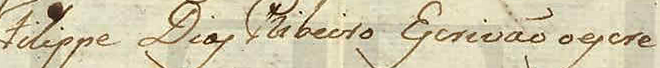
Filippe Dias Ribeiro Escrivaõ o escre
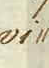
vi //
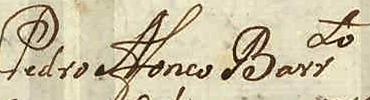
Pedro Afonso Barr.to
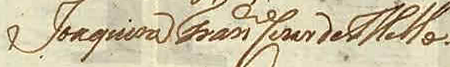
Joaquim Fran.co Cezar de Mello
